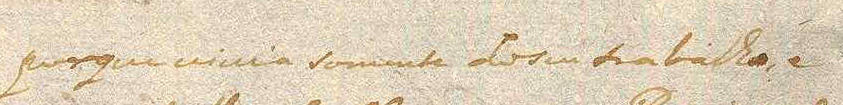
porque uiuia somente do seu trabalho, e
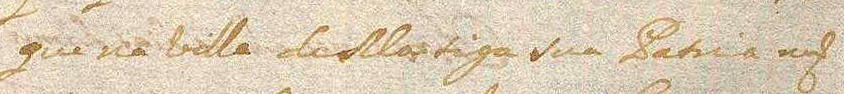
que na villa de Martiga sua Patria naõ
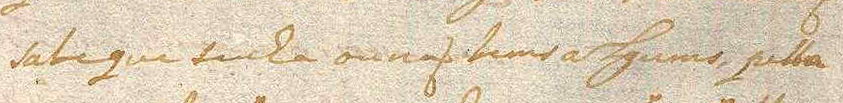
sabe que tinha ou naõ bems algums pella
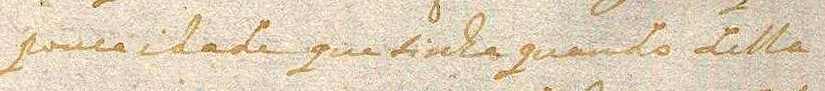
pouca idade que tinha quando della
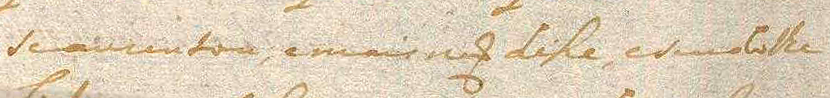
se auzentou, e mais naõ disse, e sendolhe
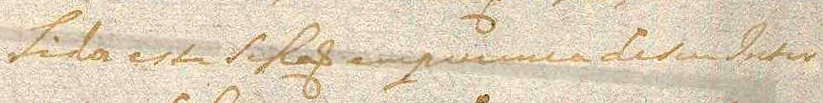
Lida esta sessaõ em prezença de seu Inter
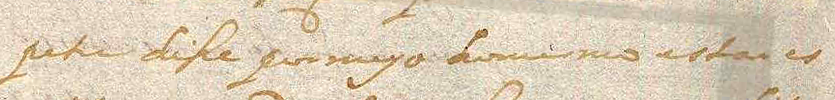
petre disse por meyo do mesmo estar es
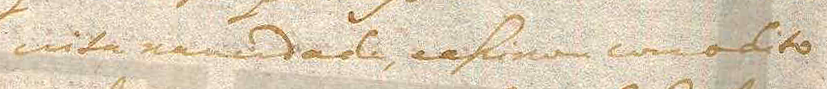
crita na uerdade, e assinou com o dito
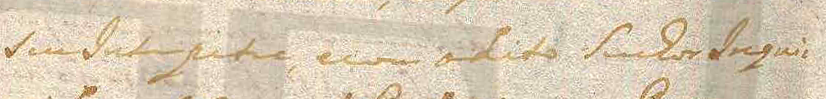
seu Intrepetre, e com o dito Senhor Inqui
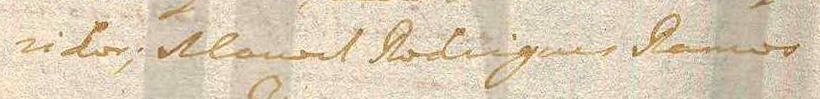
zidor, Manoel Rodrigues Ramos
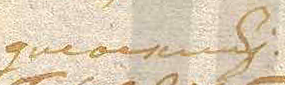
que o escreuj.
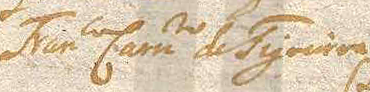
Franco Carnro de Figueiroa
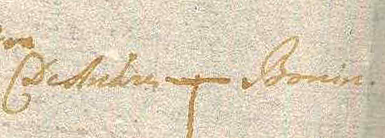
De Andre + Bonin.
